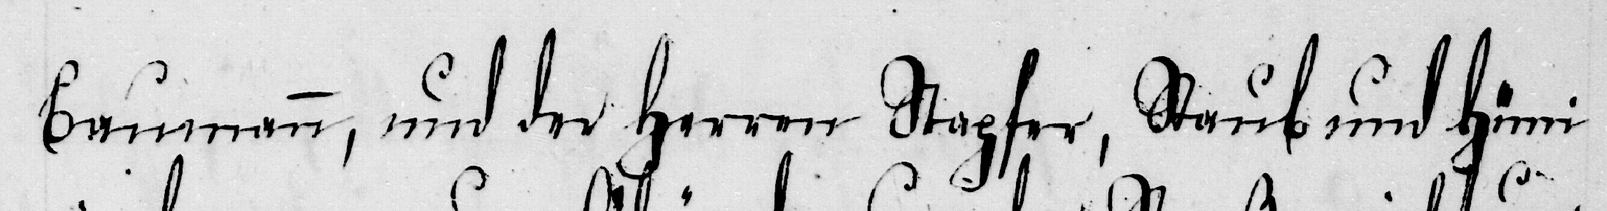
Baumann, und der Herren Stapfer, Staub und Hüni
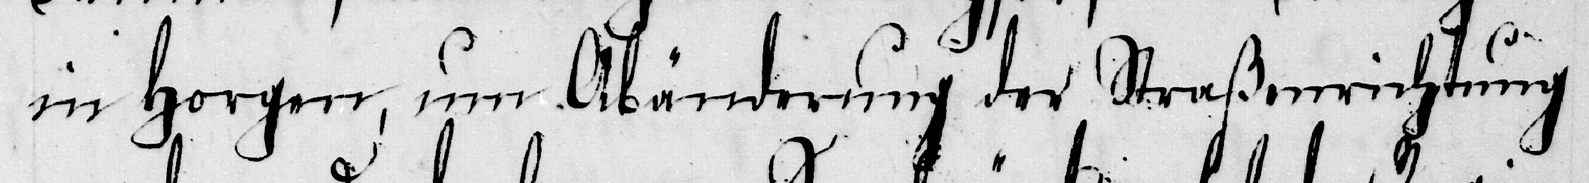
in Horgen, um Abänderung der Straßenrichtung
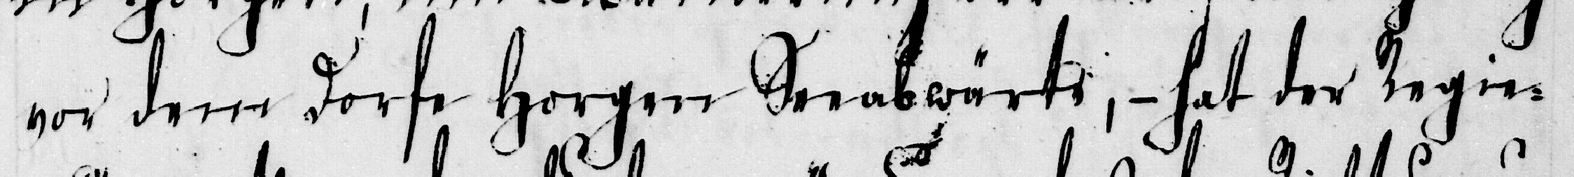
vor dem Dorfe Horgen Seeabwärts, – hat der Regie¬
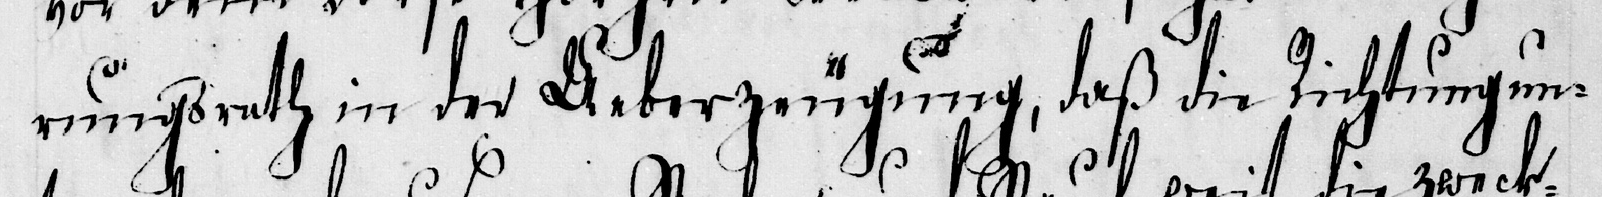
rungsrath in der Ueberzeugung, daß die Richtung un¬
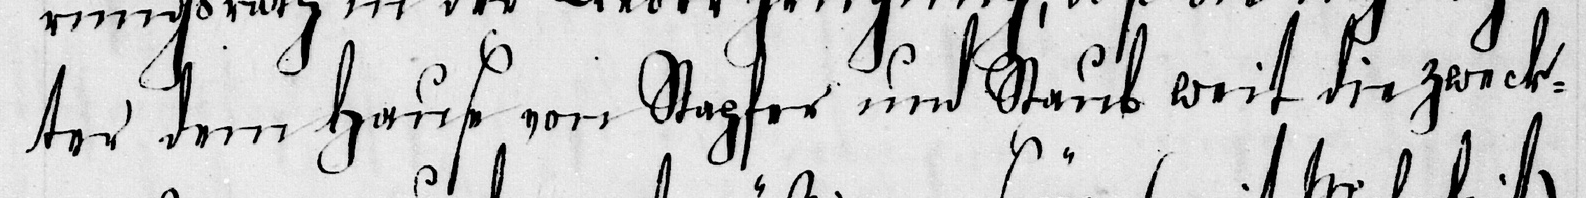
ter dem Hause von Stapfer und Staub weit die zweck¬
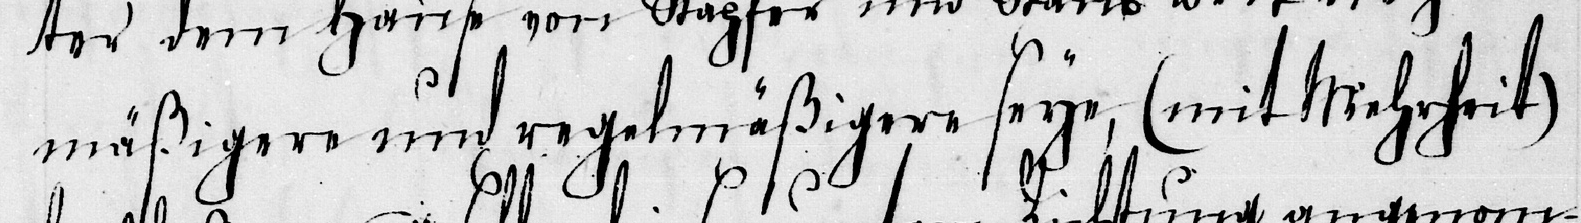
mäßigere und regelmäßigere seye, (mit Mehrheit)
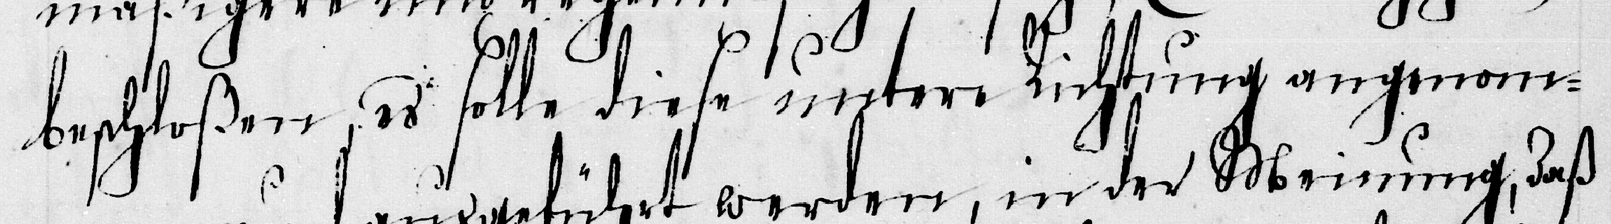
beschloßen, es solle diese untere Richtung angenom¬
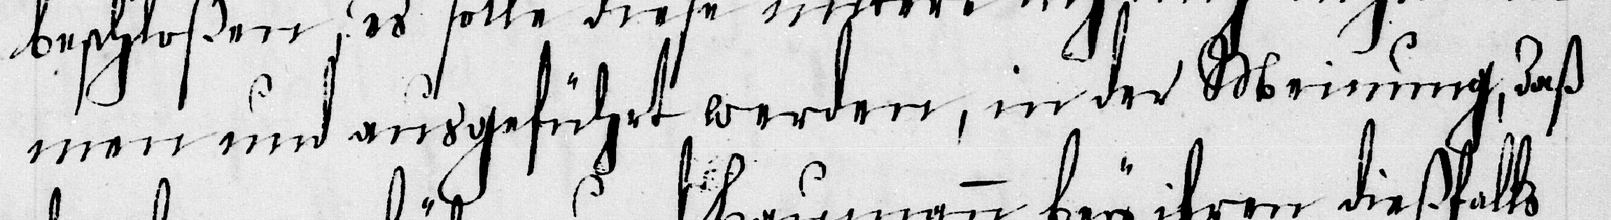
men und ausgeführt werden, in der Meinung, daß
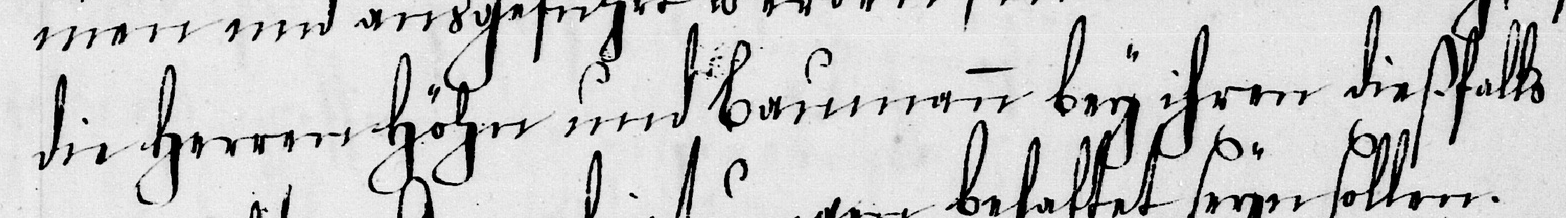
die Herrn Höhn und Baumann bey ihren dießfalls
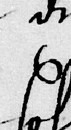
t.
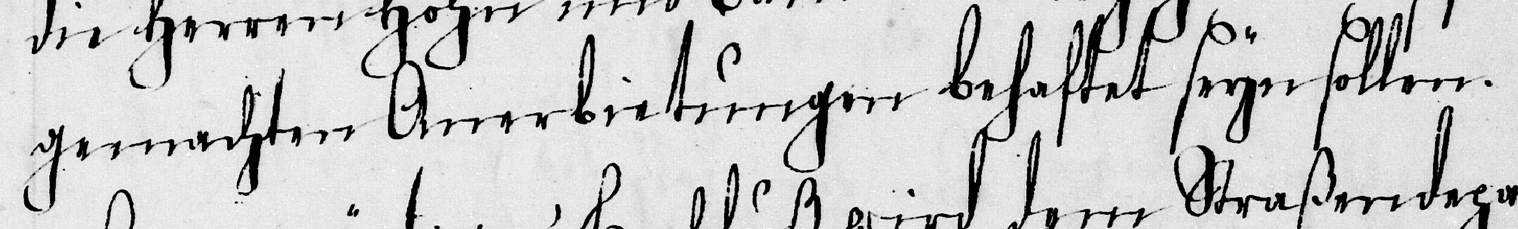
gemachten Anerbietungen behaftet seyn sollen.
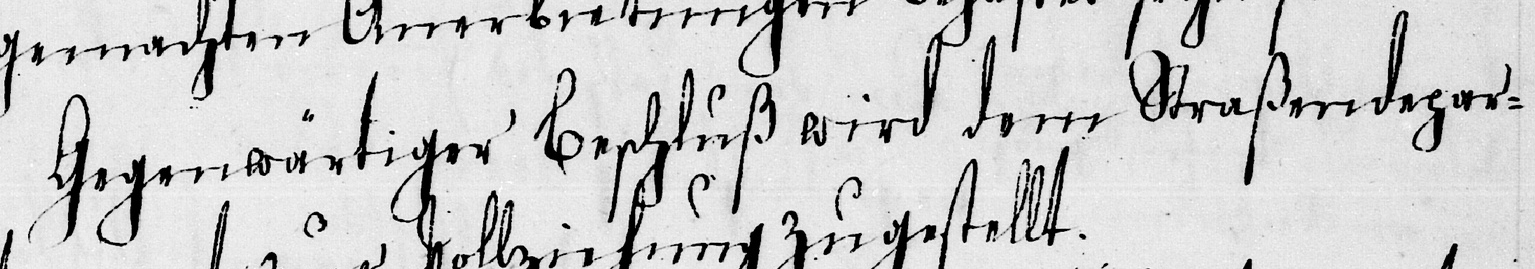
Gegenwärtiger Beschluß wird dem Straßendepar¬
